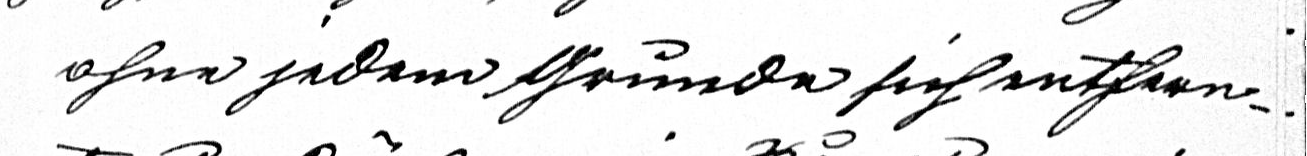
ohne jedem Grunde sich entfern¬
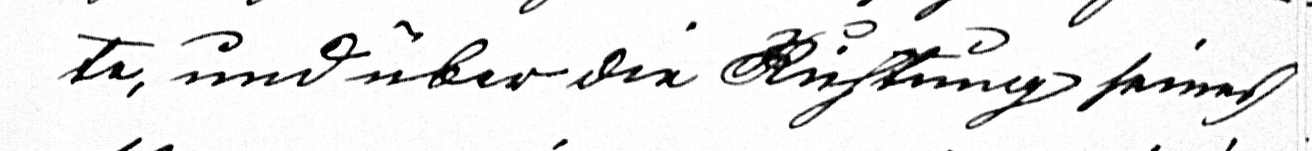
te, und über die Richtung seines
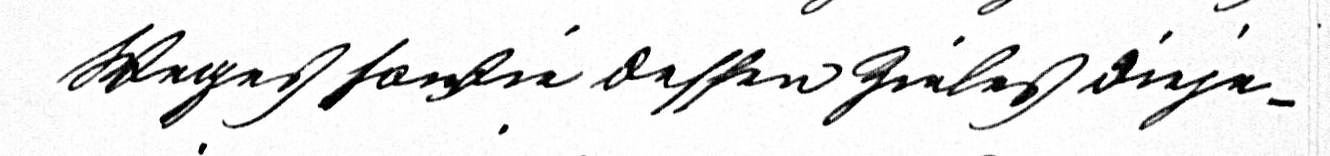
Weges sowie dessen Zieles dieje¬
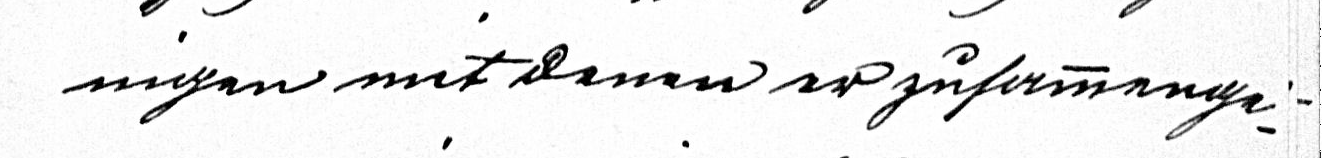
nigen mit denen er zusammenge¬
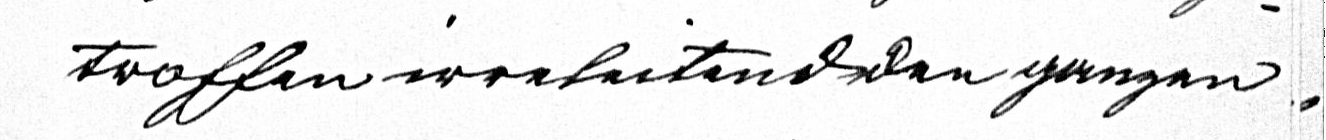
troffen irreleitende den ganzen
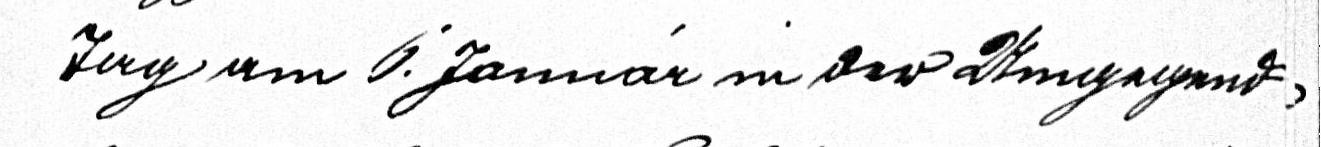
Tag am 6. Január in der Umgegend
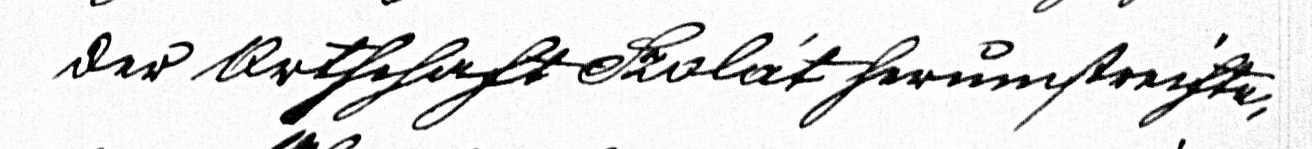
der Ortschaft Szolát herumstreifte,
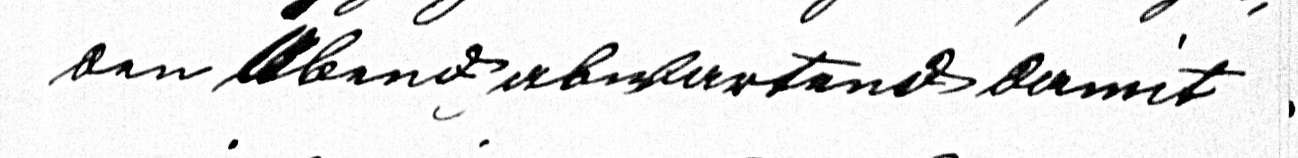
den Abend abwartend damit
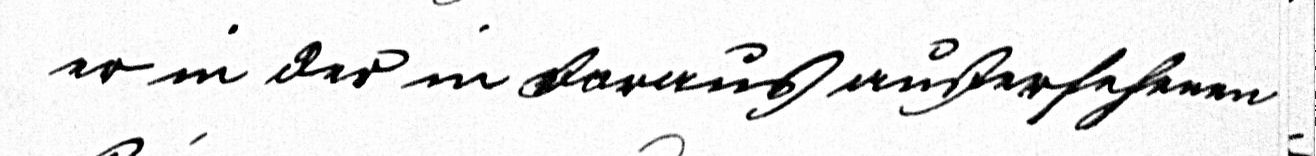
er in der in voraus ausersehenen
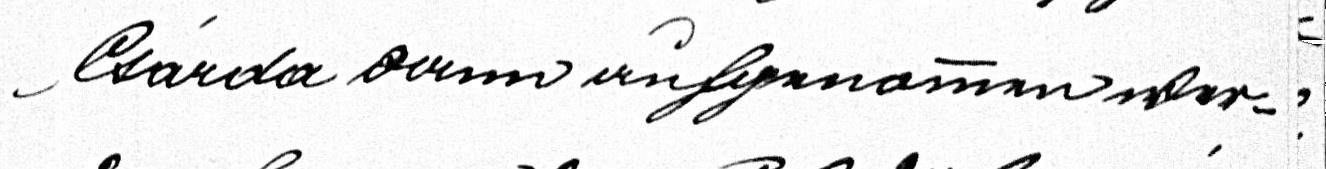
Csárda dann aufgenommen wer¬
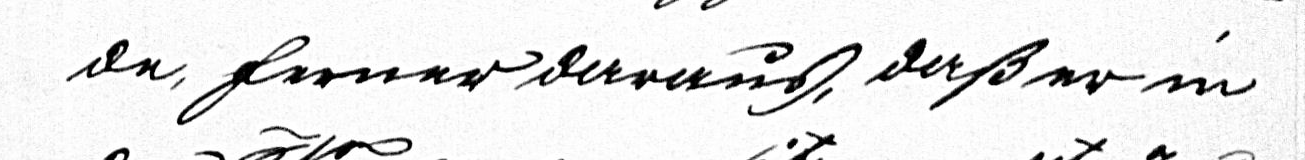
de, ferner daraus, daß er in
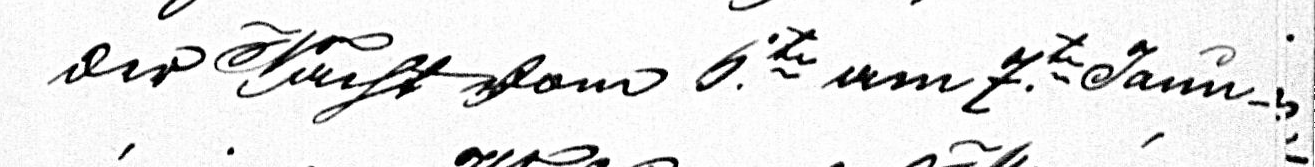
der Nacht vom 6. ten am 7. ten Janu¬
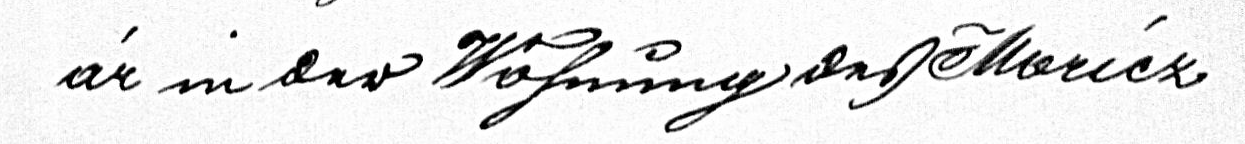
ár in der Wohnung des Moricz
